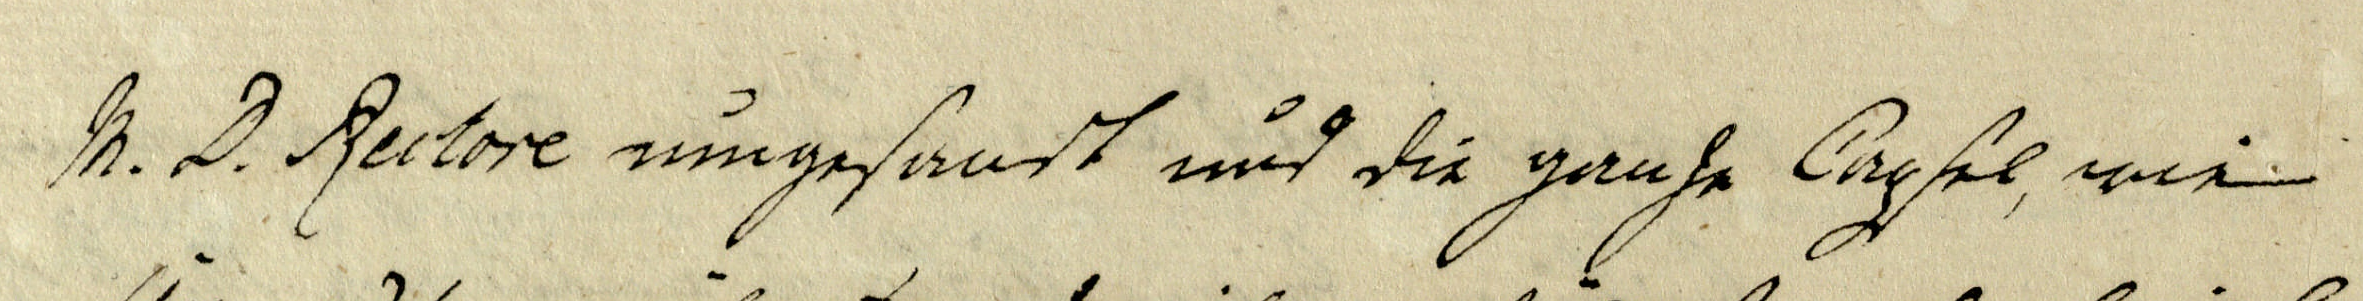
M. D. Rectore eingesandt und die ganze Capsel, wie
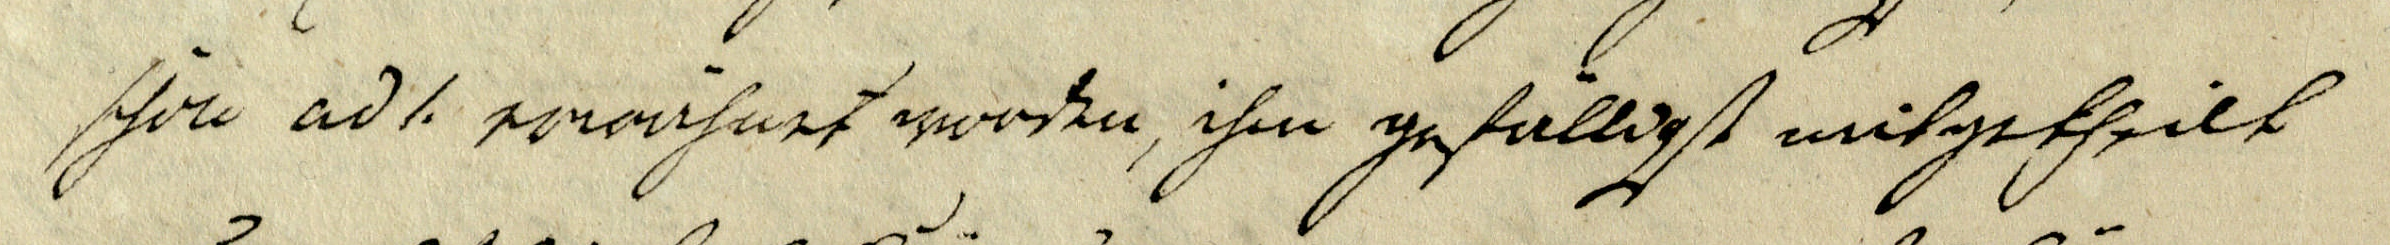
schon ad 1. erwähnet worden, ihm gefälligst mitgetheilt
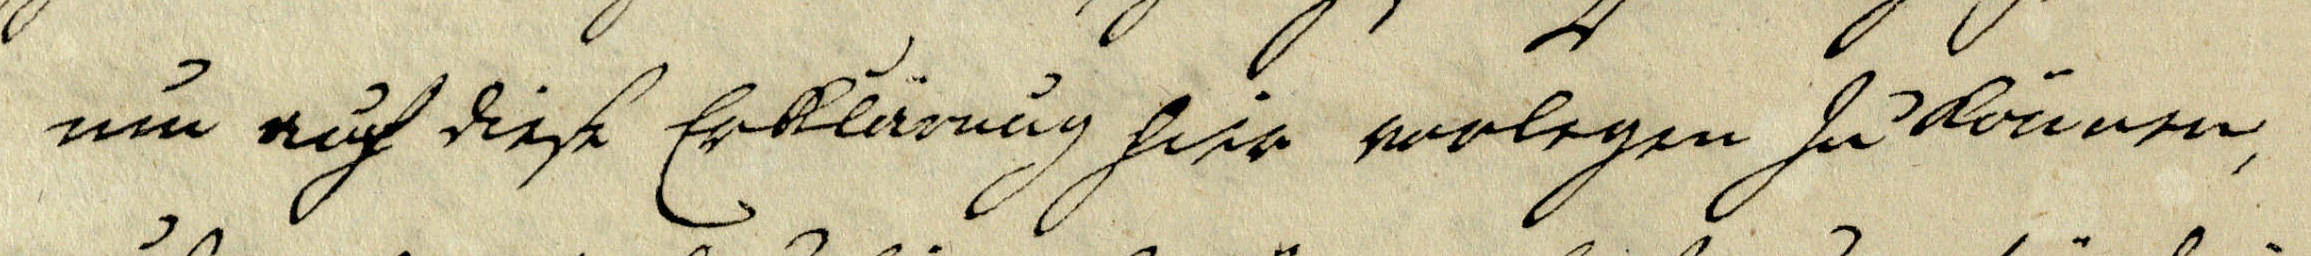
um auch diese Erklärung hier vorlegen zu können,
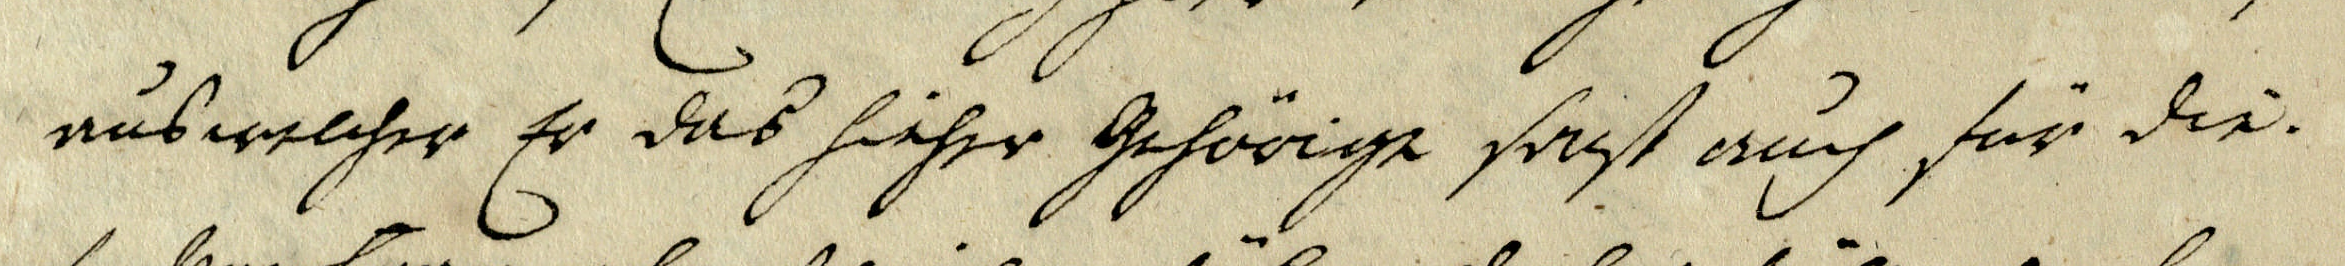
aus welcher Er das hieher Gehörige sonst auch für die¬
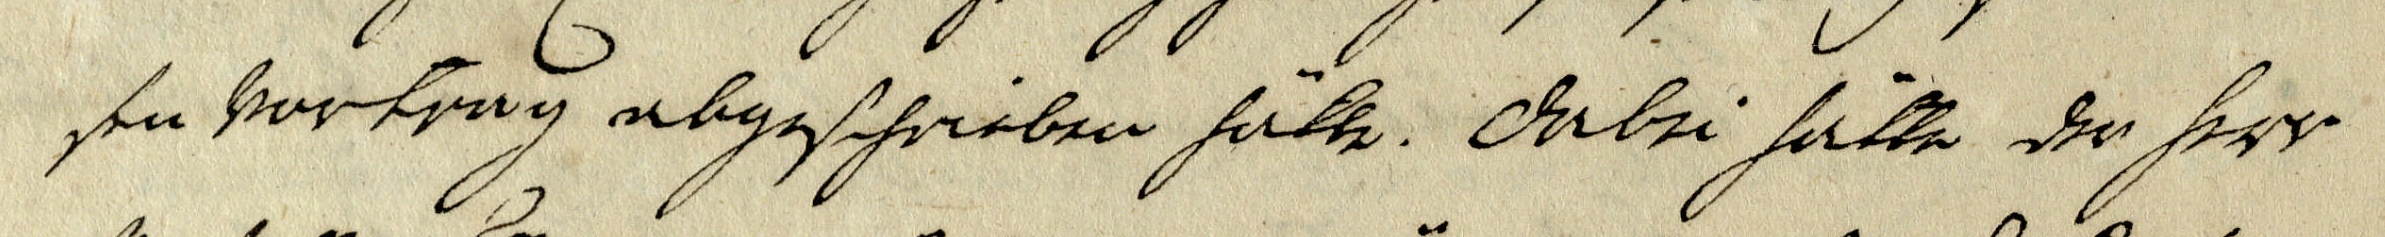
sen Vortrag abgeschrieben hätte. Dabei hätte der Herr
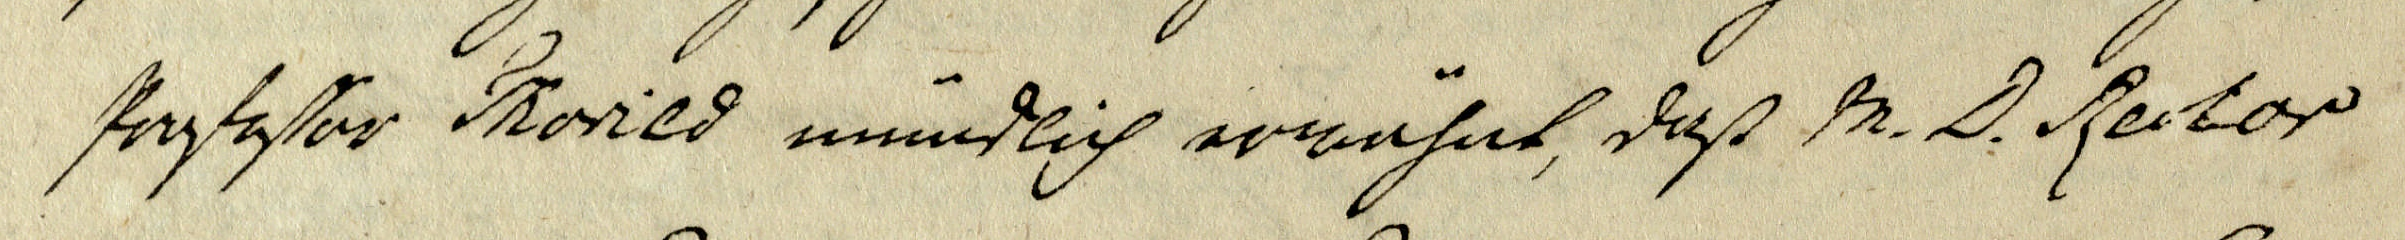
Professor Thorild mündlich erwähnt, daß M. D. Rector
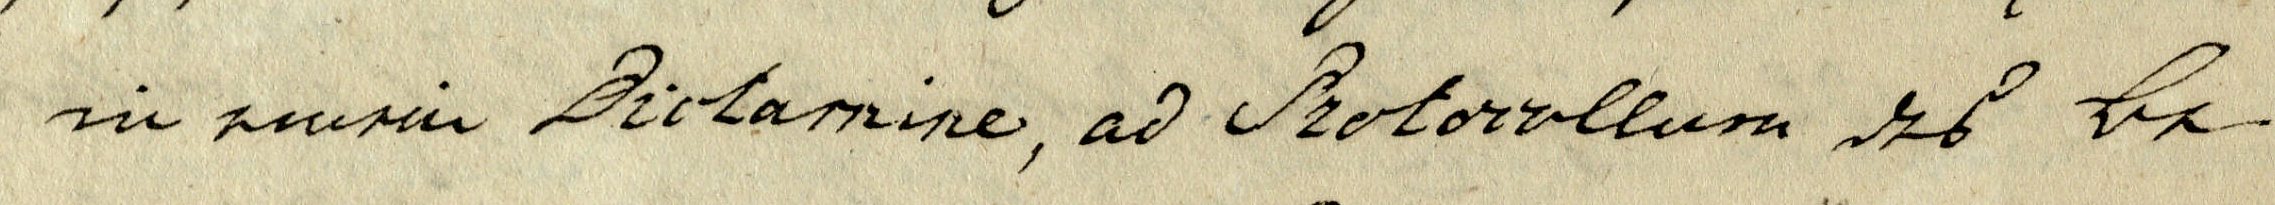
in einem Dictamine, ad Protocollum des Be¬
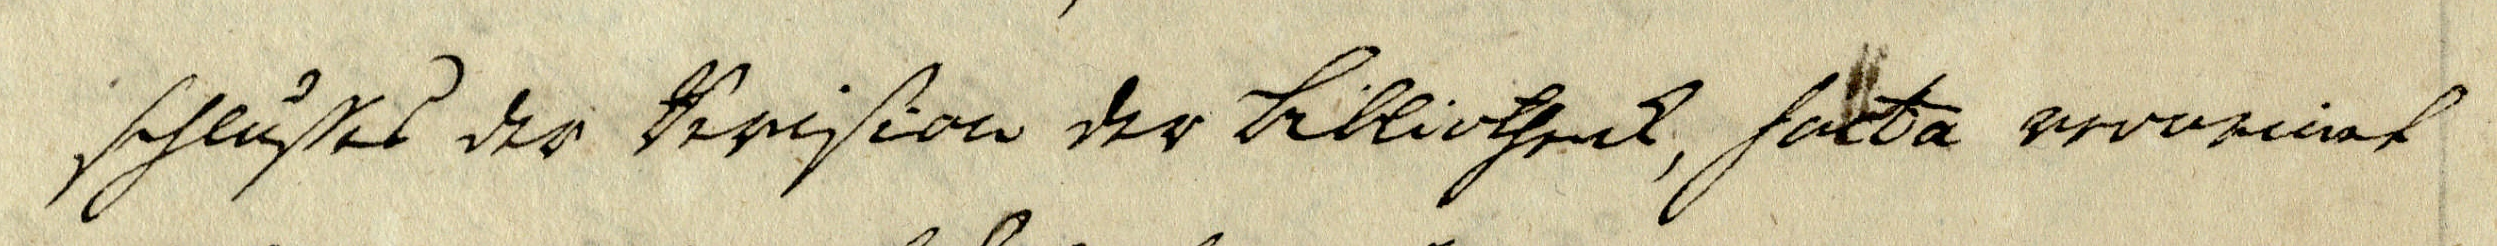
schlusses der Revision der Bibliothek, facta verneinet
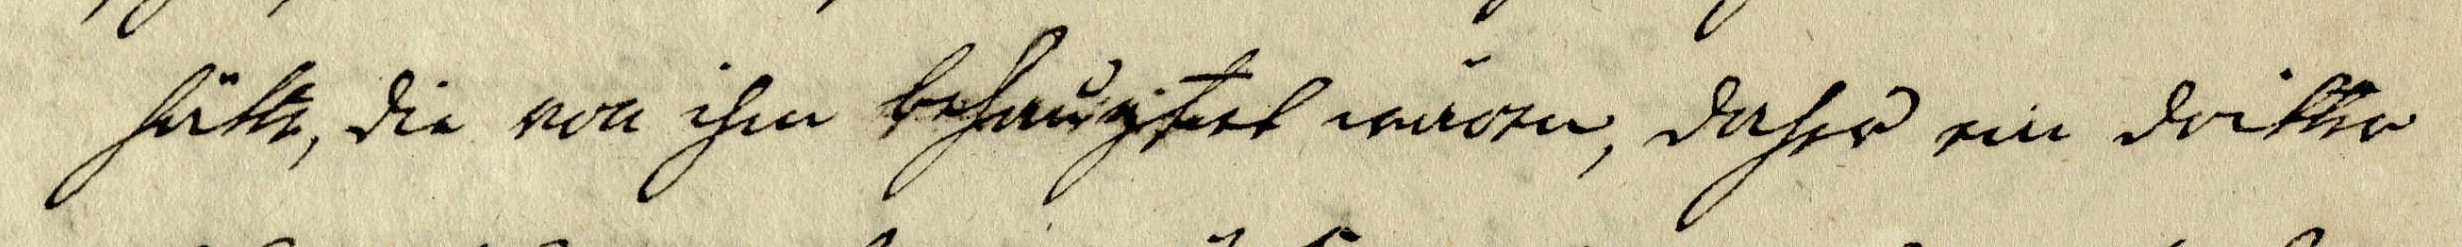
hätte, die von Ihm behauptet wären, daher ein dritter
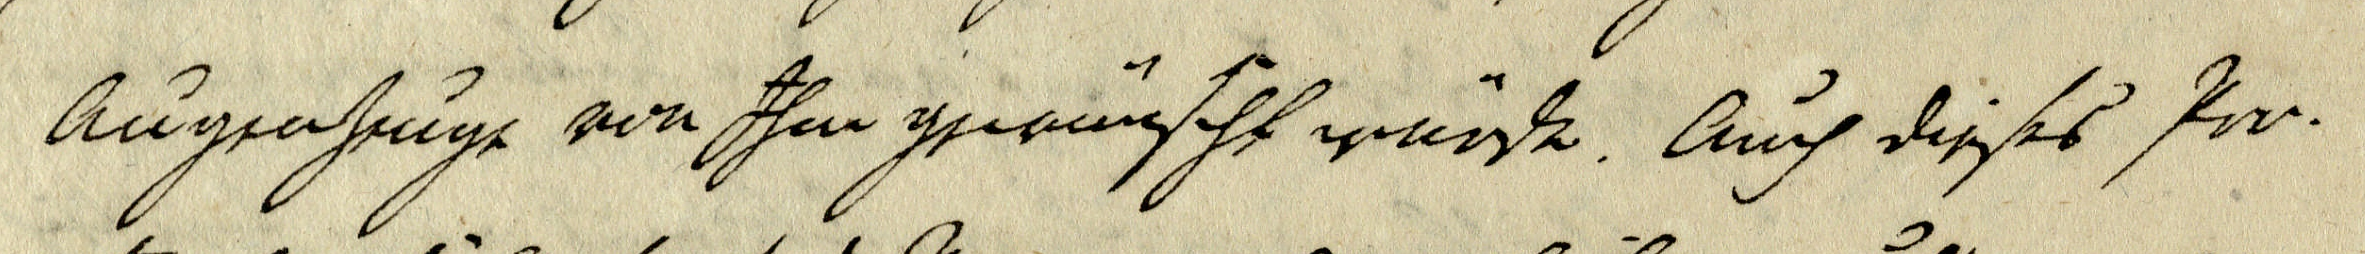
Augenzeuge von Ihm gewünscht würde. Auch dieses Pro¬
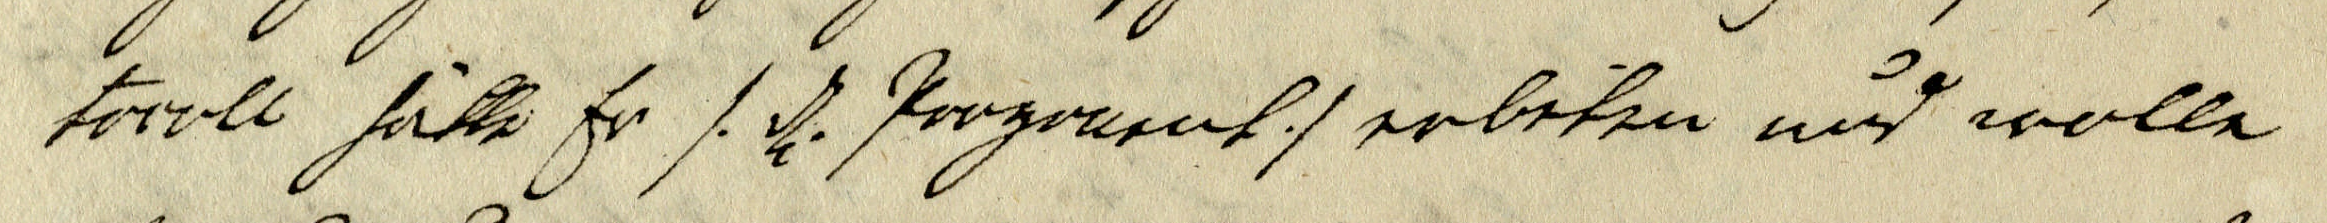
tocoll hätte Er /. dh. Proponent ./ erbeten und wolle
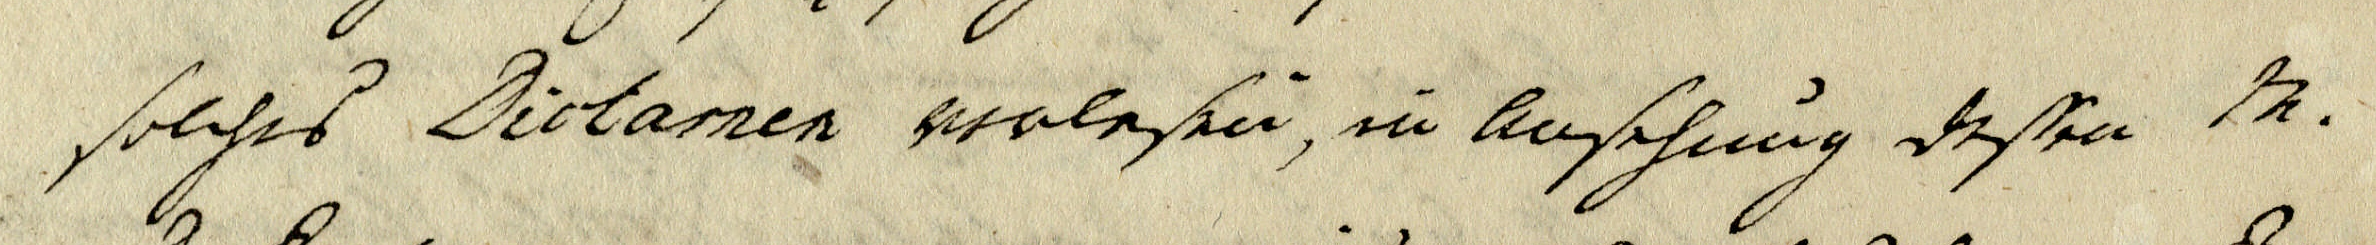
solches Dictamen verlesen, in Ansehung dessen M.
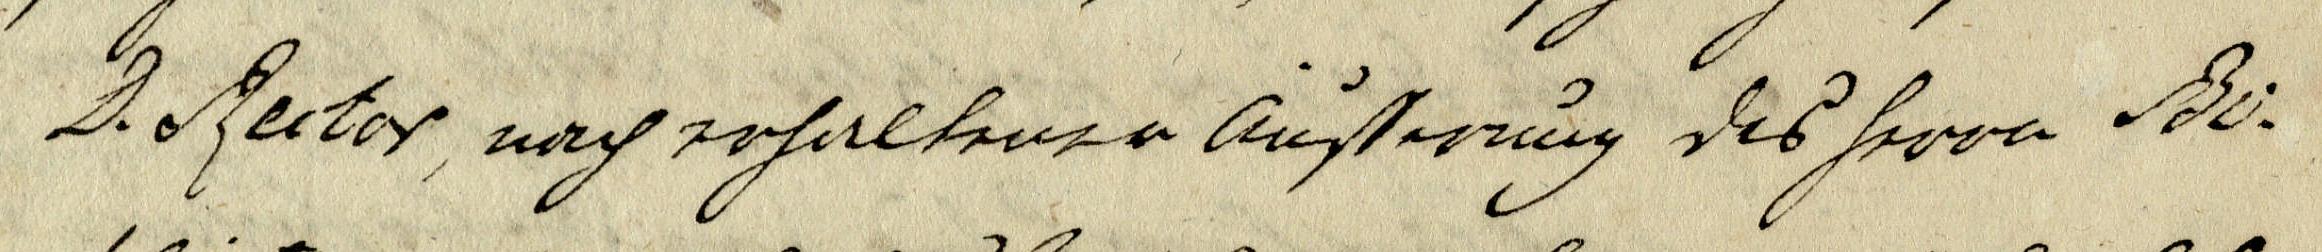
D. Rector, nach erhaltener Äusserung des Herrn Bi¬
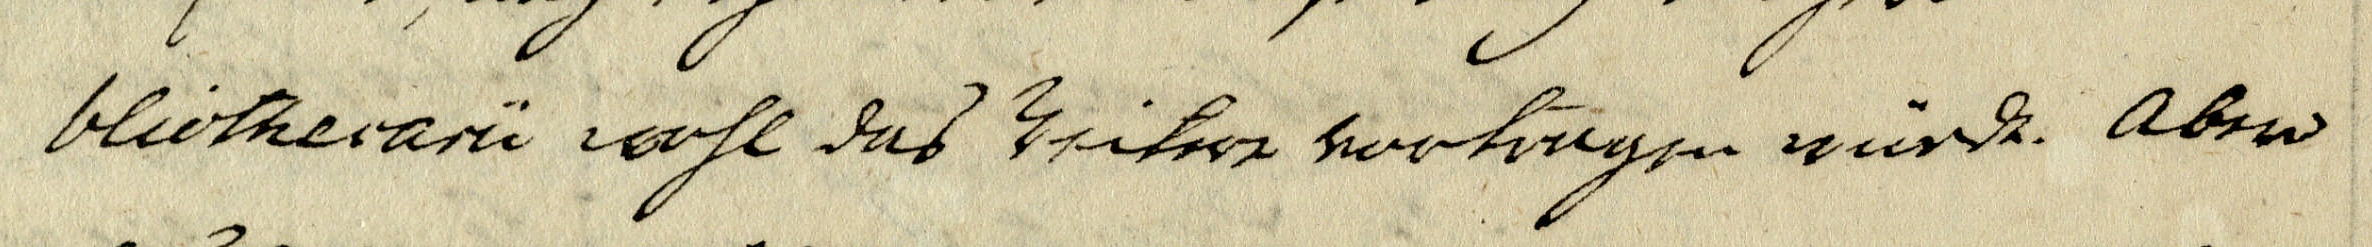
bliothecarii wohl das Weitere vortragen würde. Aber
